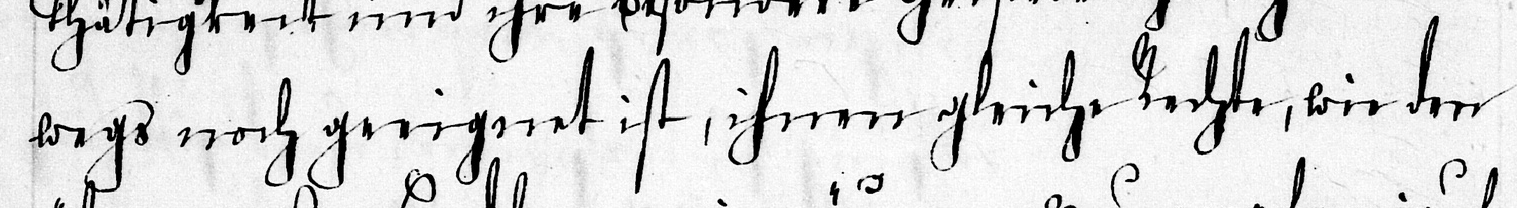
wegs noch geeignet ist, ihnen gleiche Rechte, wie den
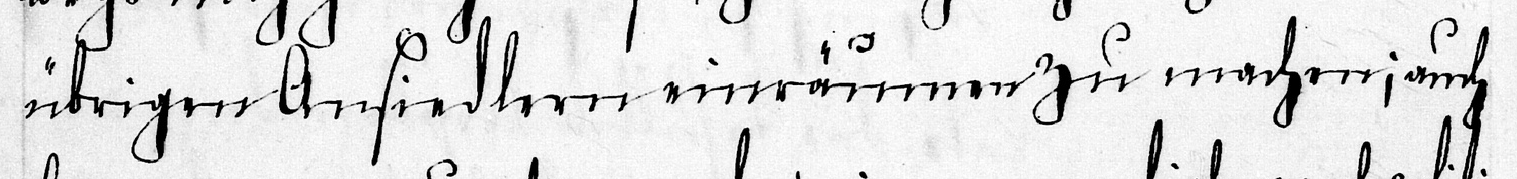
übrigen Ansiedlern einräumen zu machen; auch
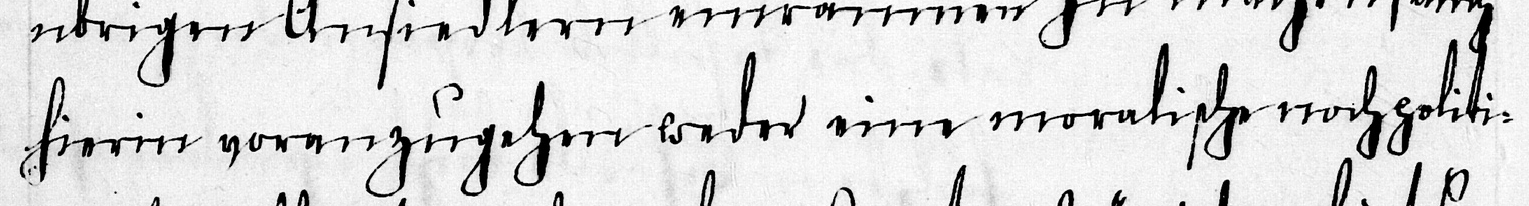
hierin voranzugehen weder eine moralische noch politi¬
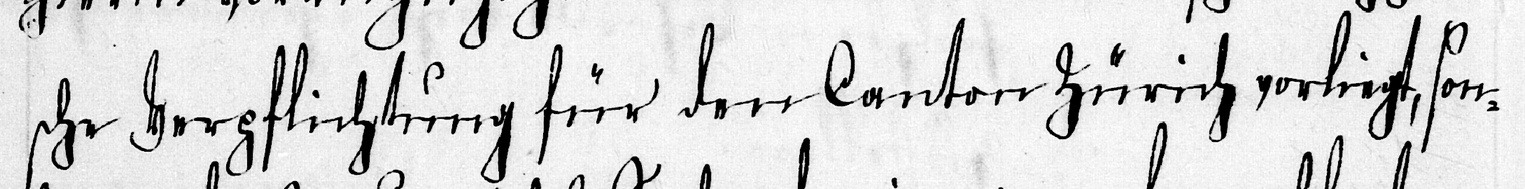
sche Verpflichtung für den Canton Zürich vorliegt, so¬
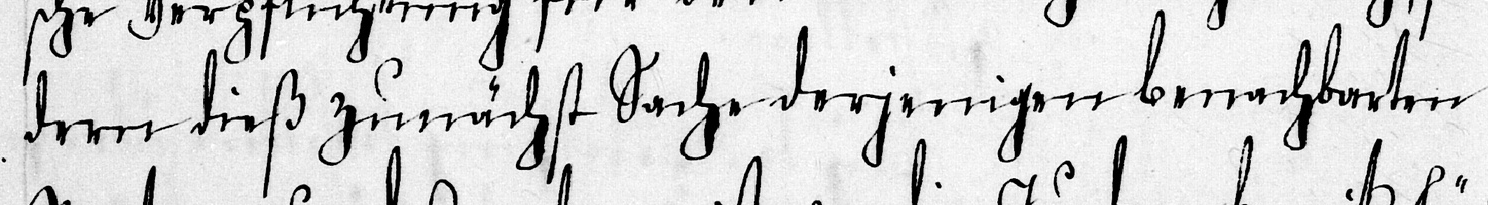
ndern dieß zunächst Sache derjenigen benachbarten
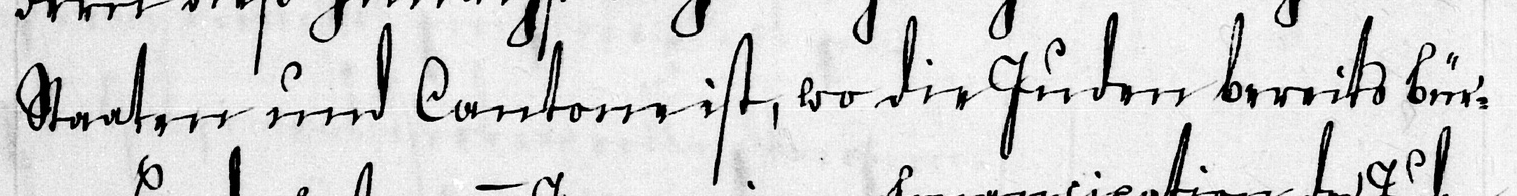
Staaten und Cantone ist, wo die Juden bereits Bür¬
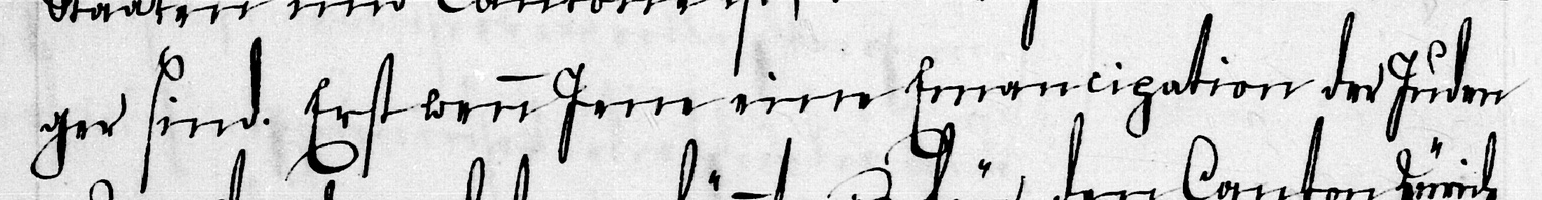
ger sind. Erst wenn Jene eine Emancipation der Juden
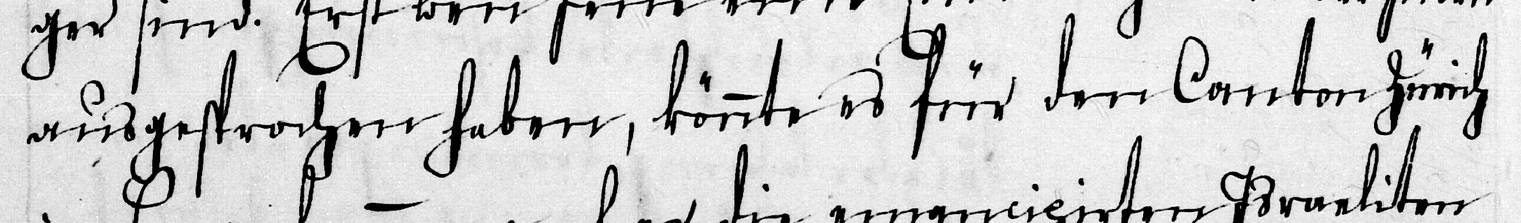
ausgesprochen haben, könnte es für den Canton Zürich
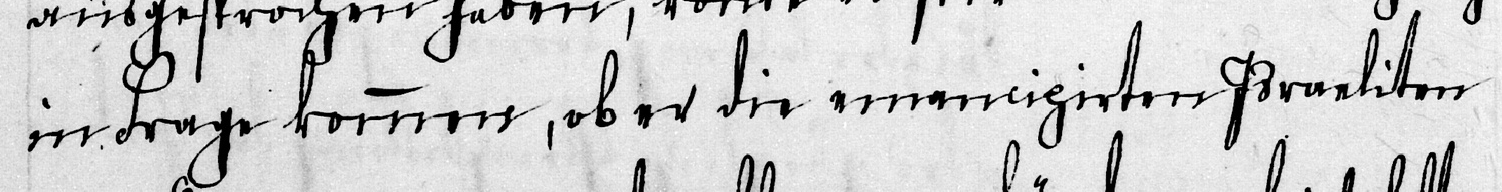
in Frage kommen, ob er die emancipirten Israeliten
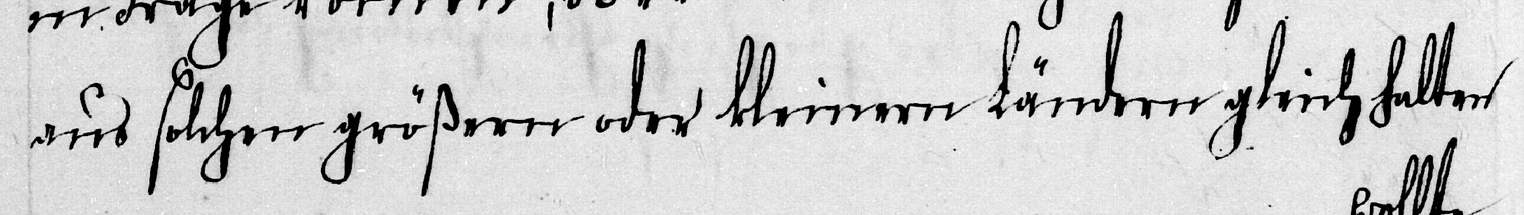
aus solchen größern oder kleinern Ländern gleich halten
